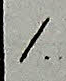1
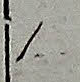1.
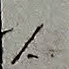1.
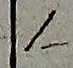1
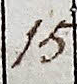15
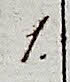1.
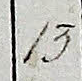13
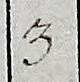3
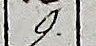9.
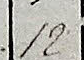12
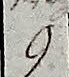9
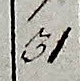31
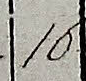16
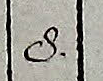8.
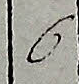6
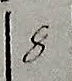8
